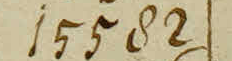15582
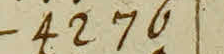4276
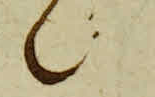2:
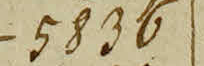5836
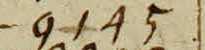9145
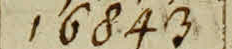16843
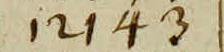12143
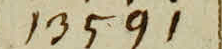13591
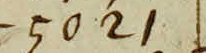5021
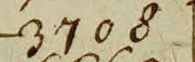3708
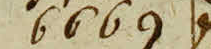6669
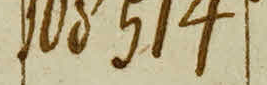108514
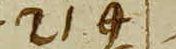219
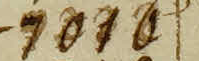7016
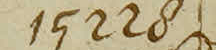15228
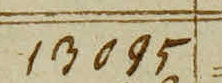13095
